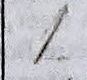1
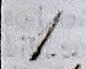1
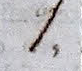1
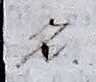2
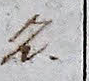2.
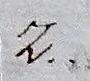2.
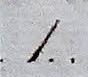1.
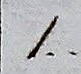1.
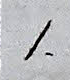1
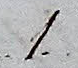1.
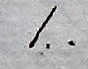1.
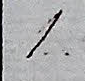1.
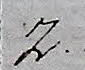2
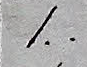1.
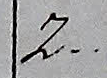2.
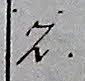2
